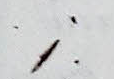1.
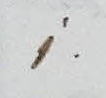1.
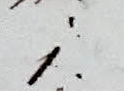1.
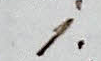1
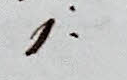1.
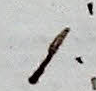1
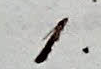1
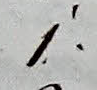1
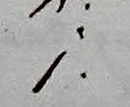1.
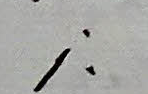1.
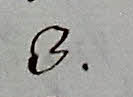3.
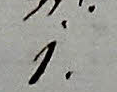1.
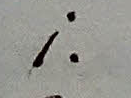1.
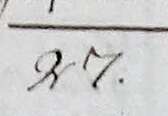27.
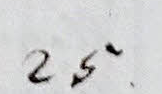25
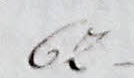62
